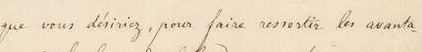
que vous désiriez, pour faire ressortir les avanta-
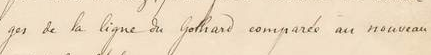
ges de la ligne du Gothard comparée au nouveau
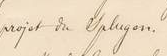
projet du Splugen.
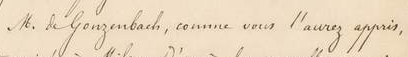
M. de Gonzenbach, comme vous l'aurez appris,
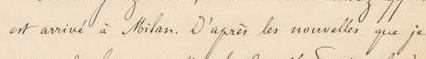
est arrivé à Milan. D'après les nouvelles que je
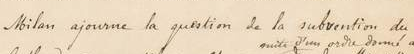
Milan ajourne la question de la subvention du
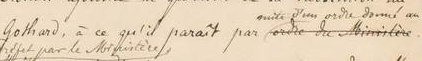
Gothard, à ce qu'il paraît par ordre du Ministère.suite
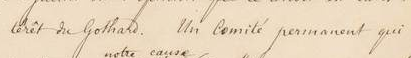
térêt du Gothard. Un Comité permanent qui
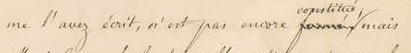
me l'avez écrit, n'est pas encore forméconstitué; mais
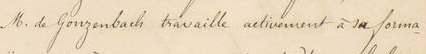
M. de Gonzenbach travaille activement à sa forma-
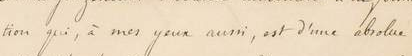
tion qui, à mes yeux aussi, est d'une absolue
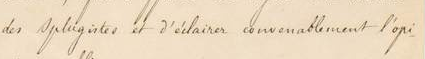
des Splugistes et d'éclairer convenablement l'opi-
